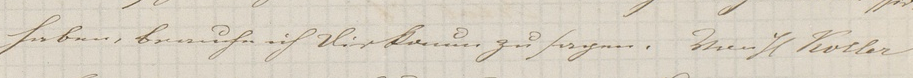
haben, brauche ich Dir kaum zu sagen. Von Herrn Koller
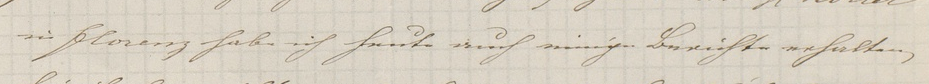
in Florenz habe ich heute auch einige Berichte erhalten,
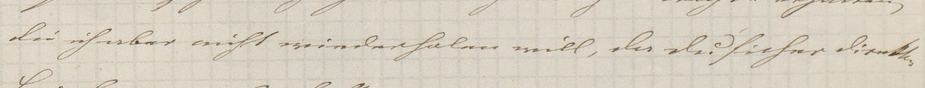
die ich aber nicht wiederholen will, da Du sicher direkte
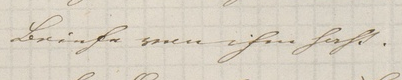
Briefe von ihm hast.
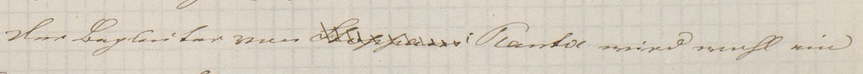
Der Begleiter von Stoppani Planta wird wohl ein
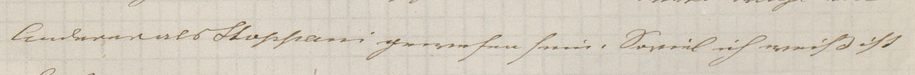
Anerer als Stoppani gewesen sein. Soiel ich weiß ist
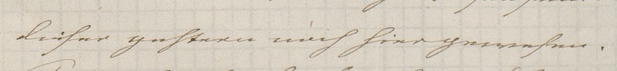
dieser gestern noch hier gewesen.
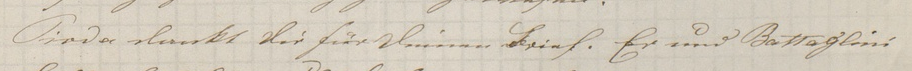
Pioda dankt Dir für Deinen Brief. Er und Battaglini
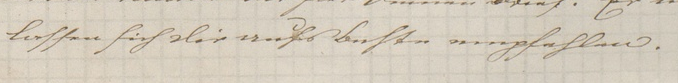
lassen sich Dir aufs Beste empfehlen.
